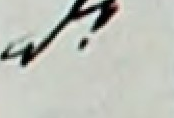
do
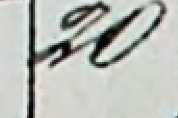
20
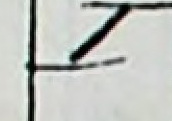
I
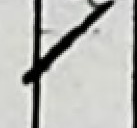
7
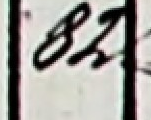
82
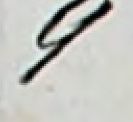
9
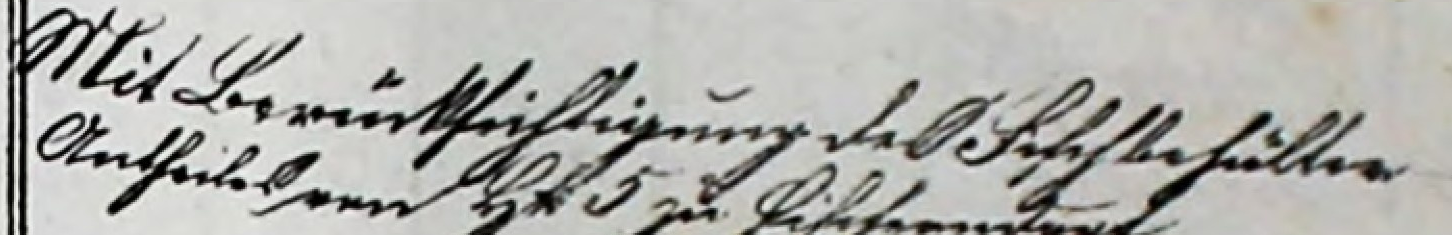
Mit Berücksichtigung des Fischbefälter
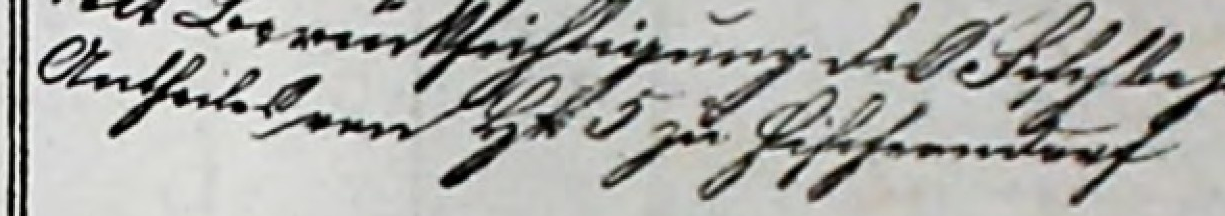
Antheiles von H? 5 zu Fischerndorf
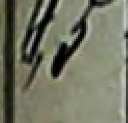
4,5
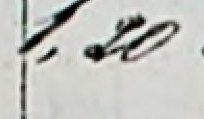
1,20
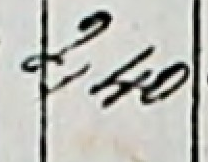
2,40
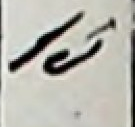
15
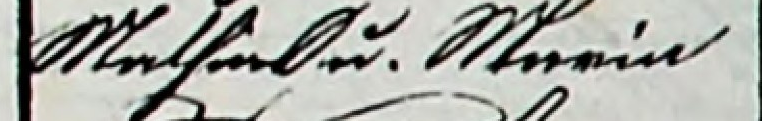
Mathias u. Maria
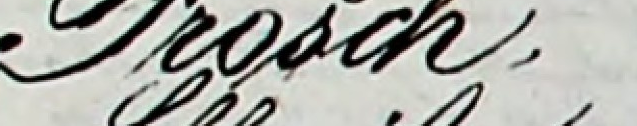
Frosch
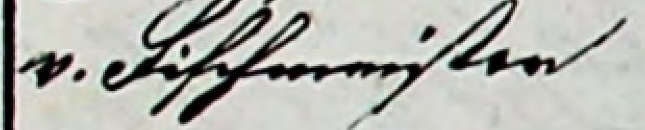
v. Fischmünster
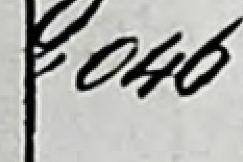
0,046
